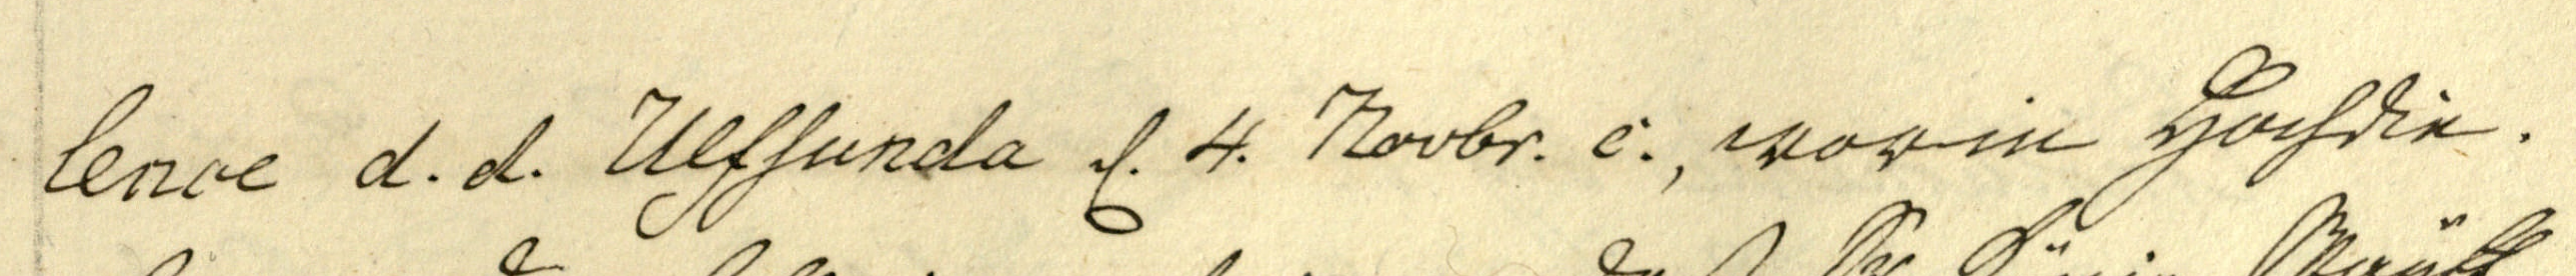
lence d. d. Ulfsunda d. 4. Novbr. c. worin Hochdie¬
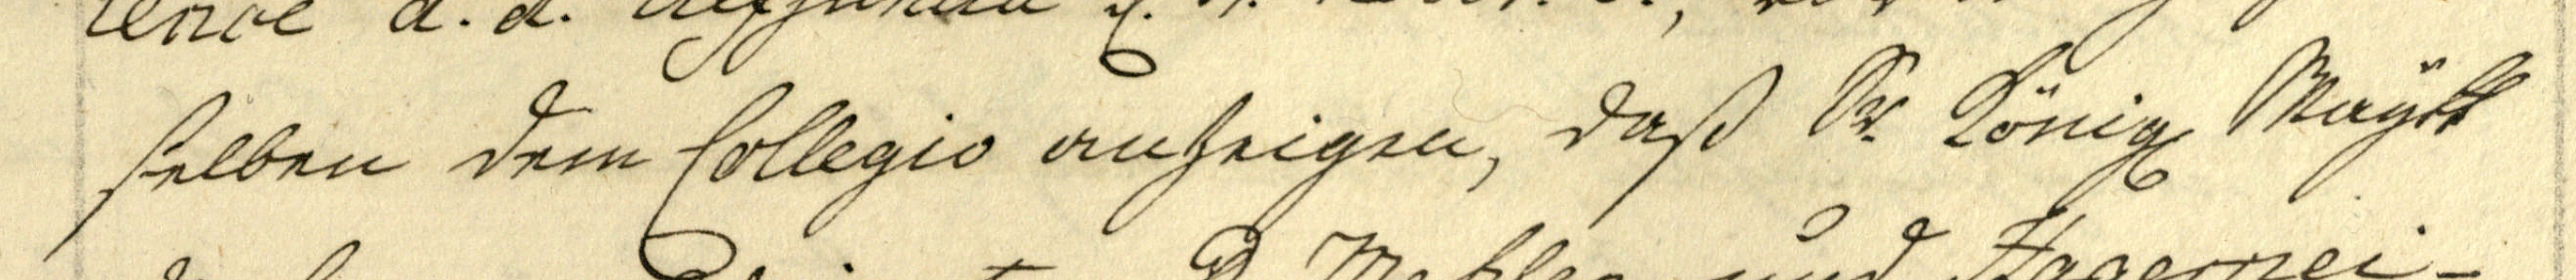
selben dem Collegio anzeigen, daß Sr Königl. Maÿtt.
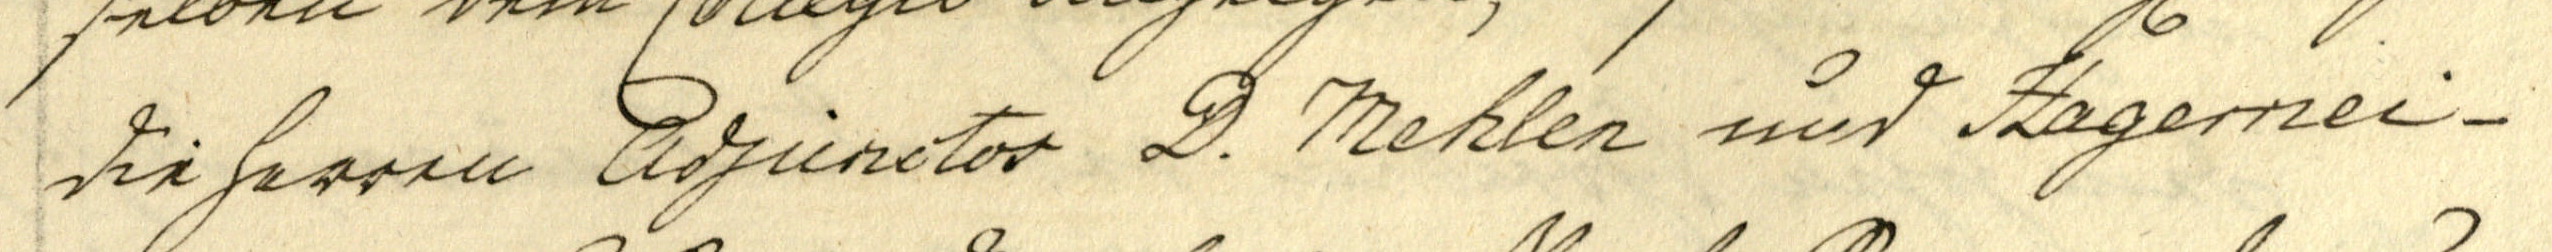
die Herren Adjuncto D. Mehlen und Hagemei-
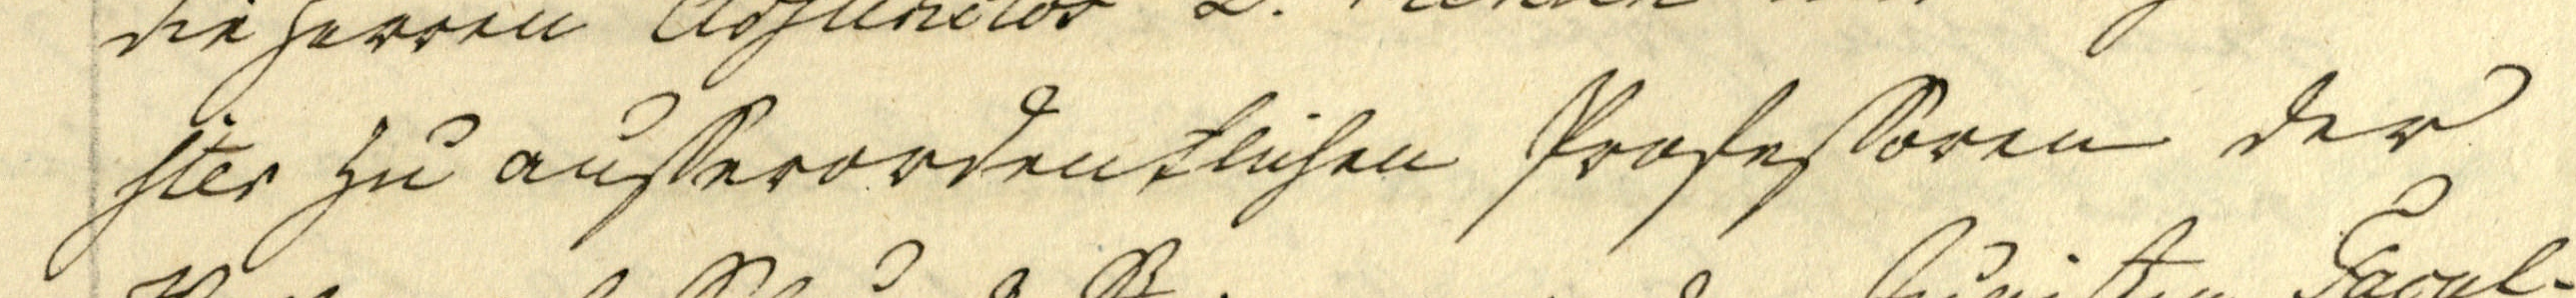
ster zu ausserordentlichen Professoren der
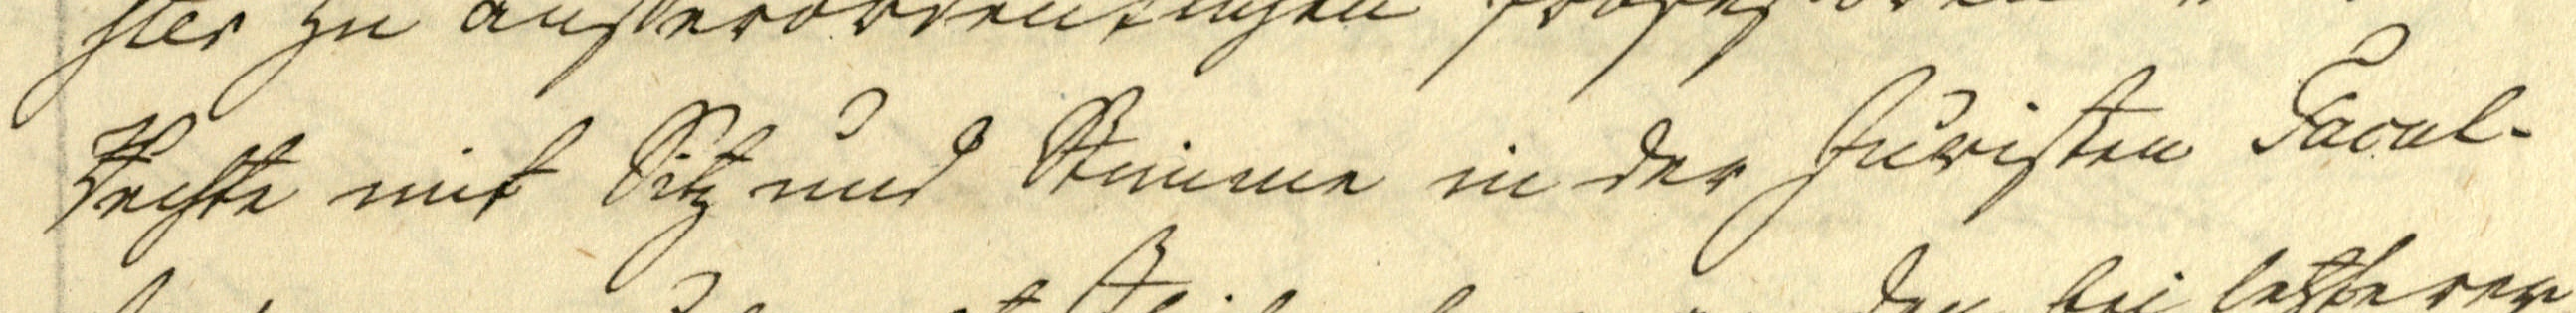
Rechte mit Sitz und Stimme in der Juristen Facul¬
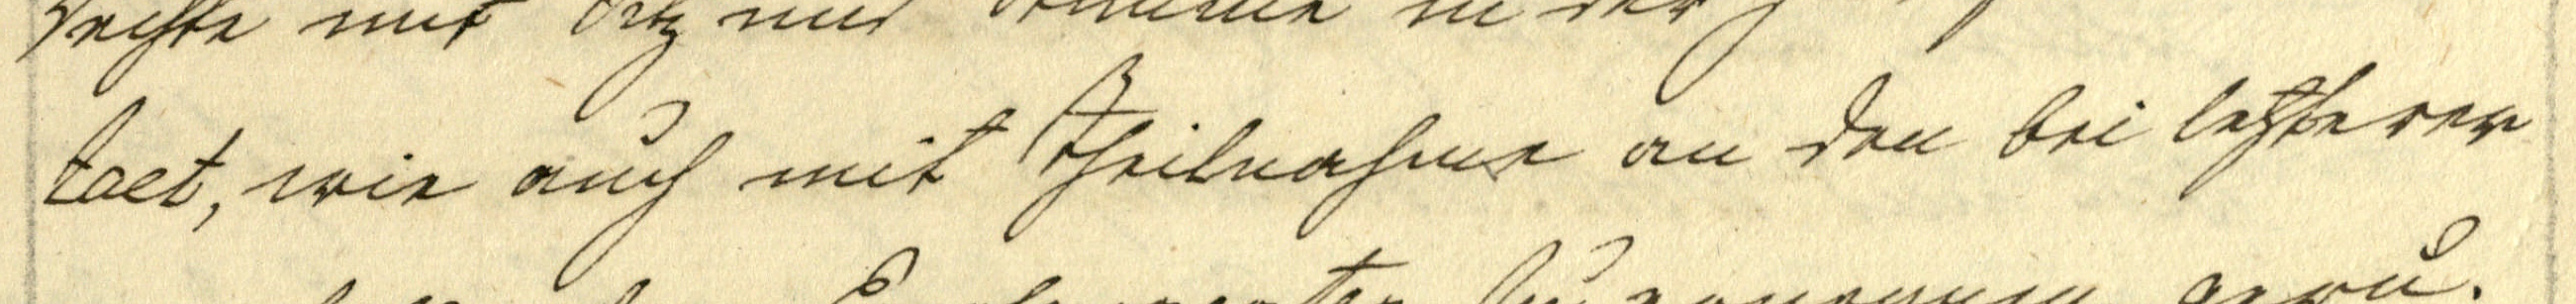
taet, wie auch mit Theilnahme an den bei letzterer
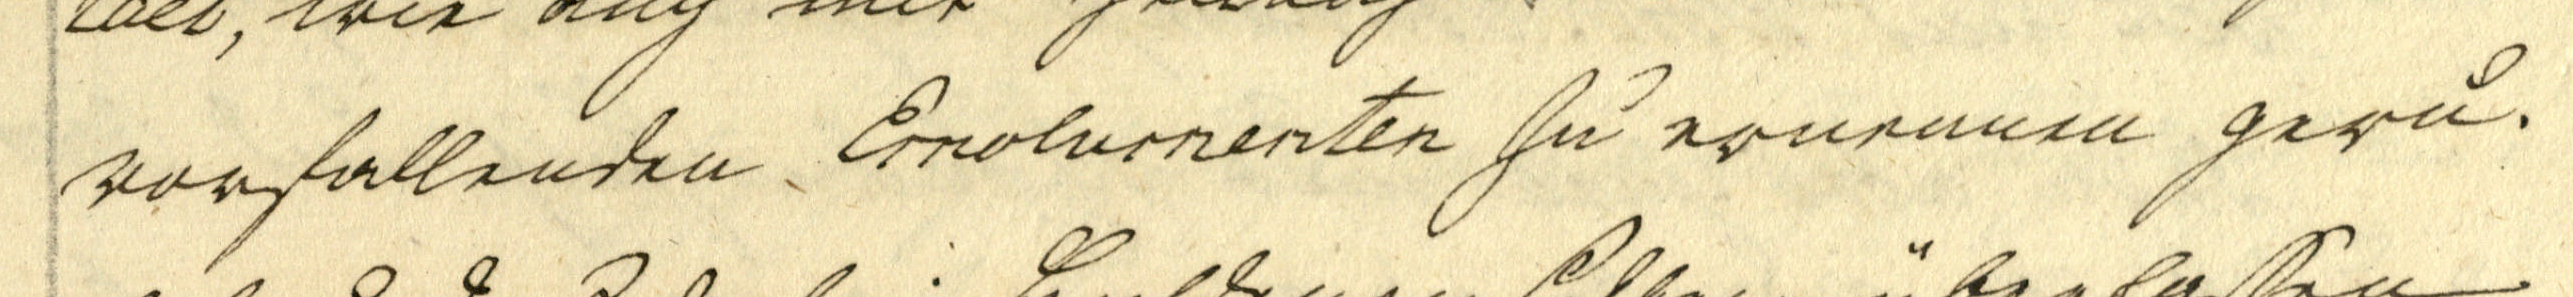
vorfallenden Emolumenten zu ernennen geru¬
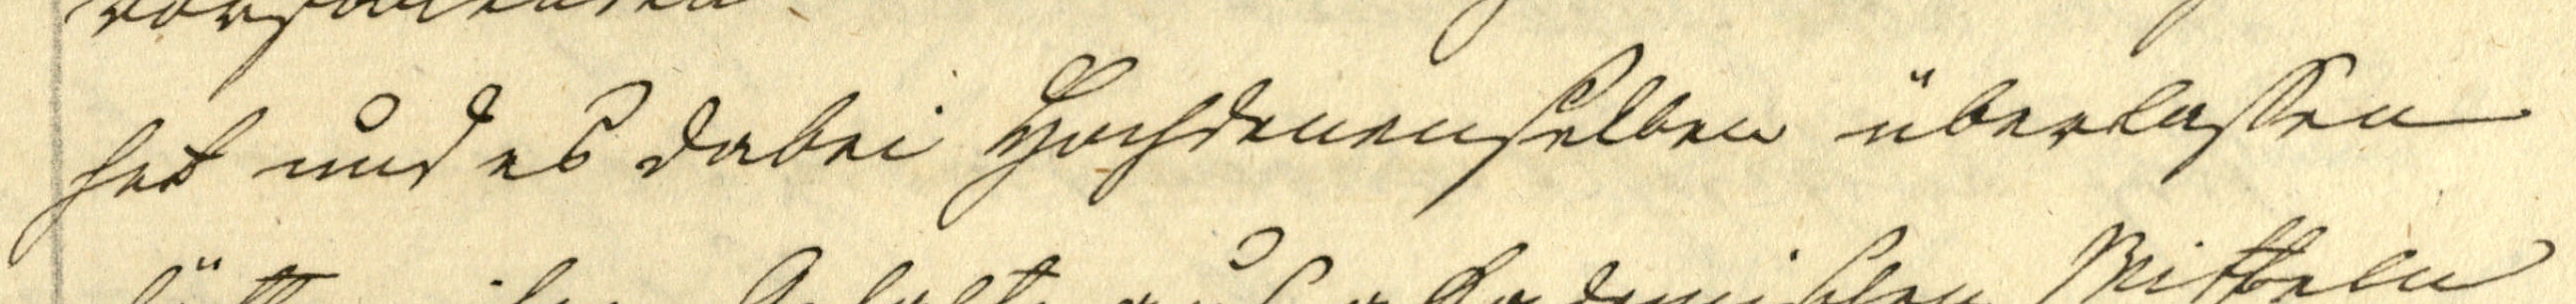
het und es dabei Hochdenenselben überlassen
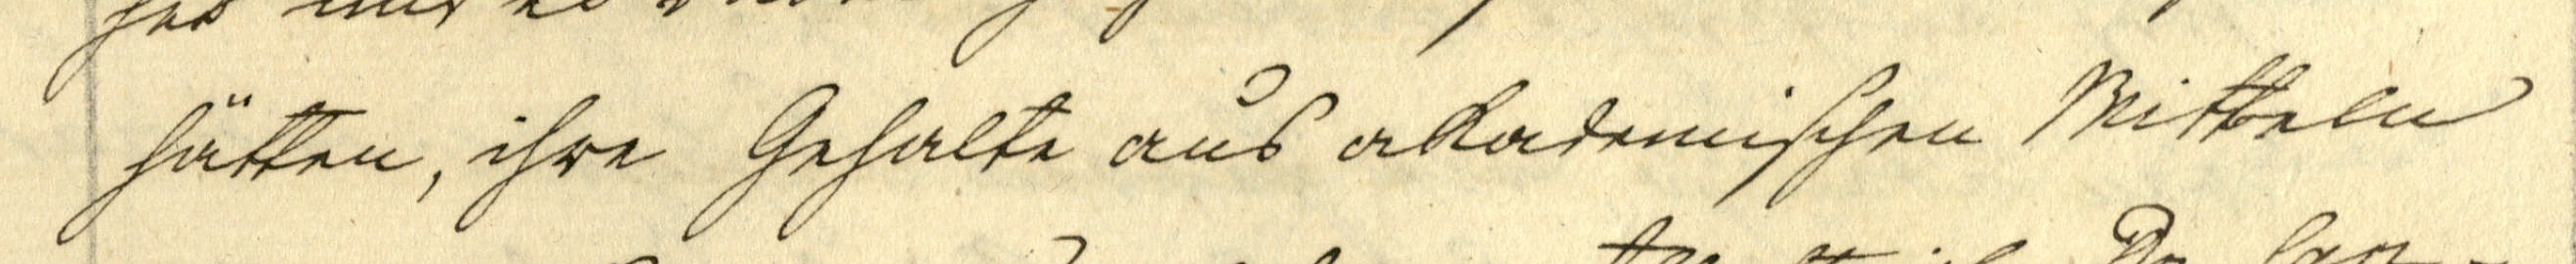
hätten, ihre Gehalte aus akademischen Mitteln
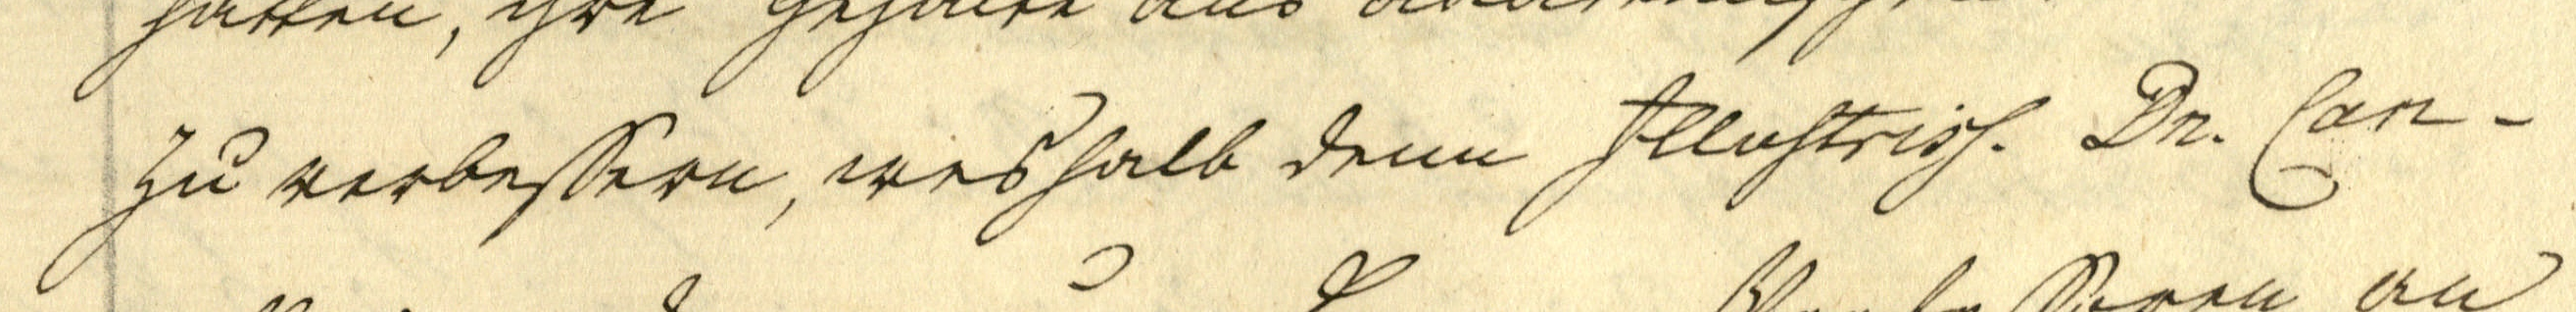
zu verbessern, weshalb denn Illustriss. Dn. Can¬
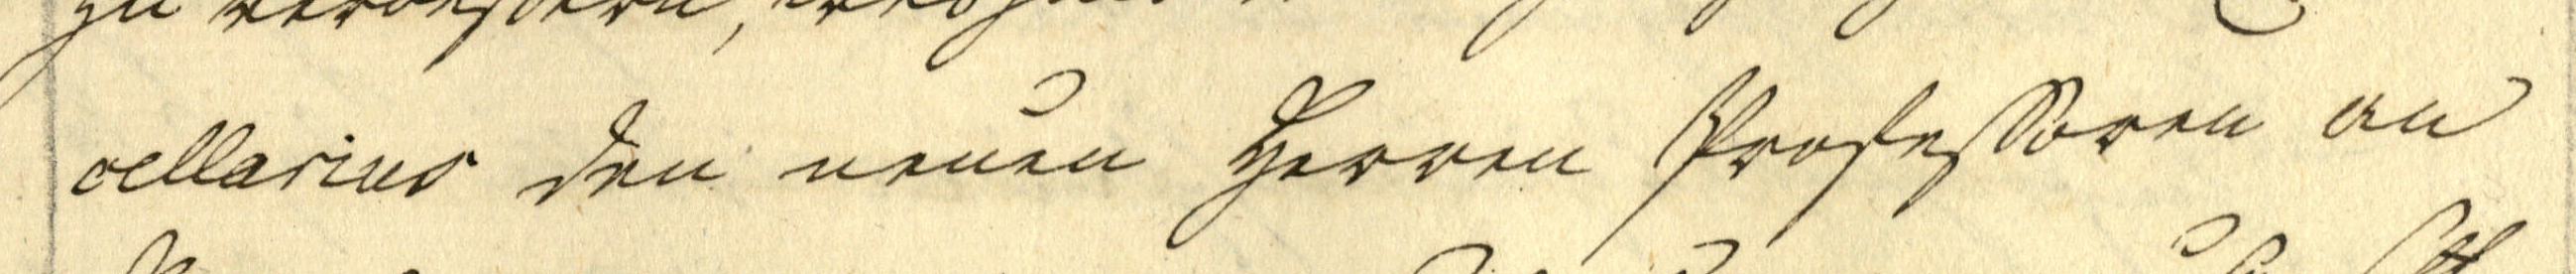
cellarius den neuen Herren Professoren an
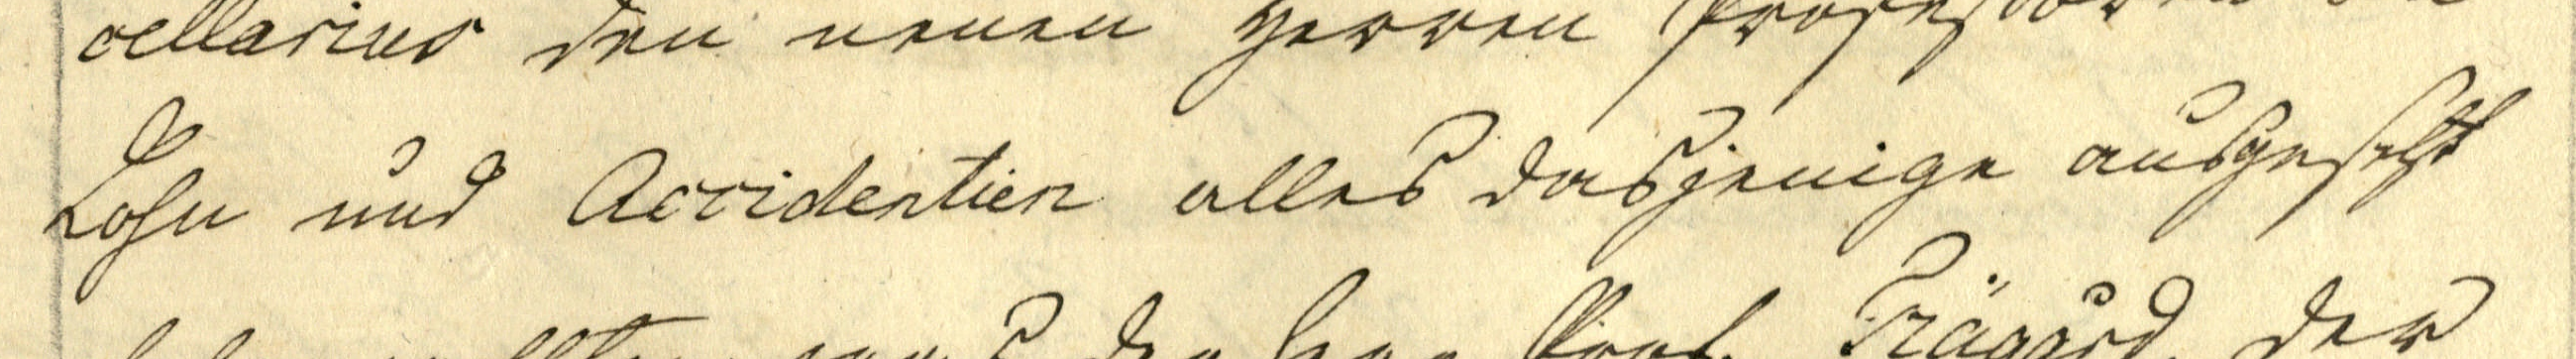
Lohn und Accidenten alles dasjenige ausgesetzt
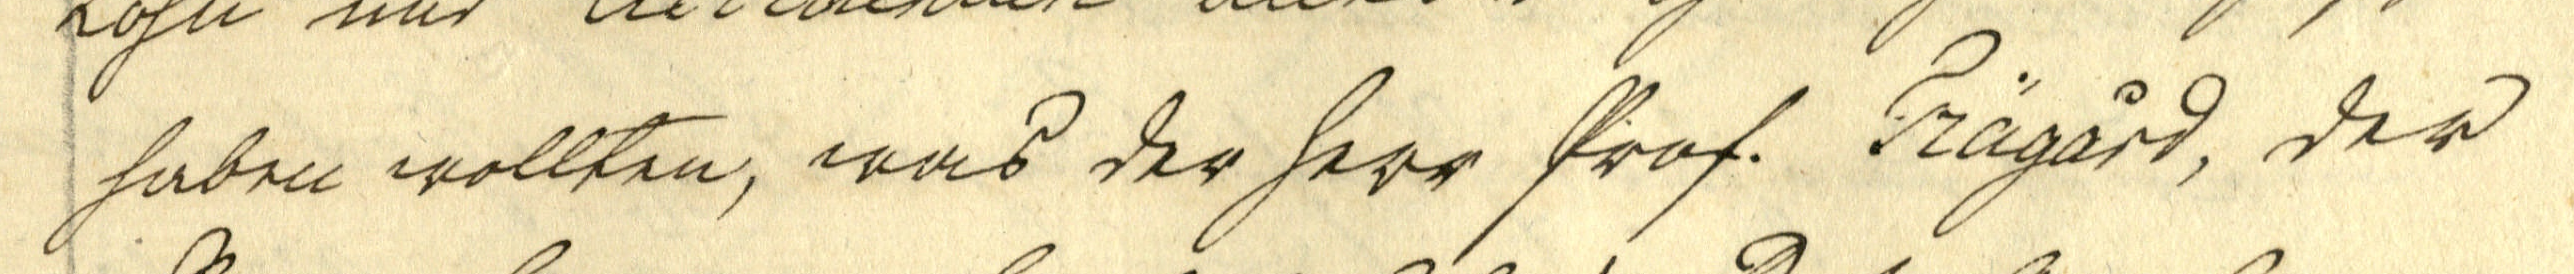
haben wollten, was der Herr Prof. Trägård, der
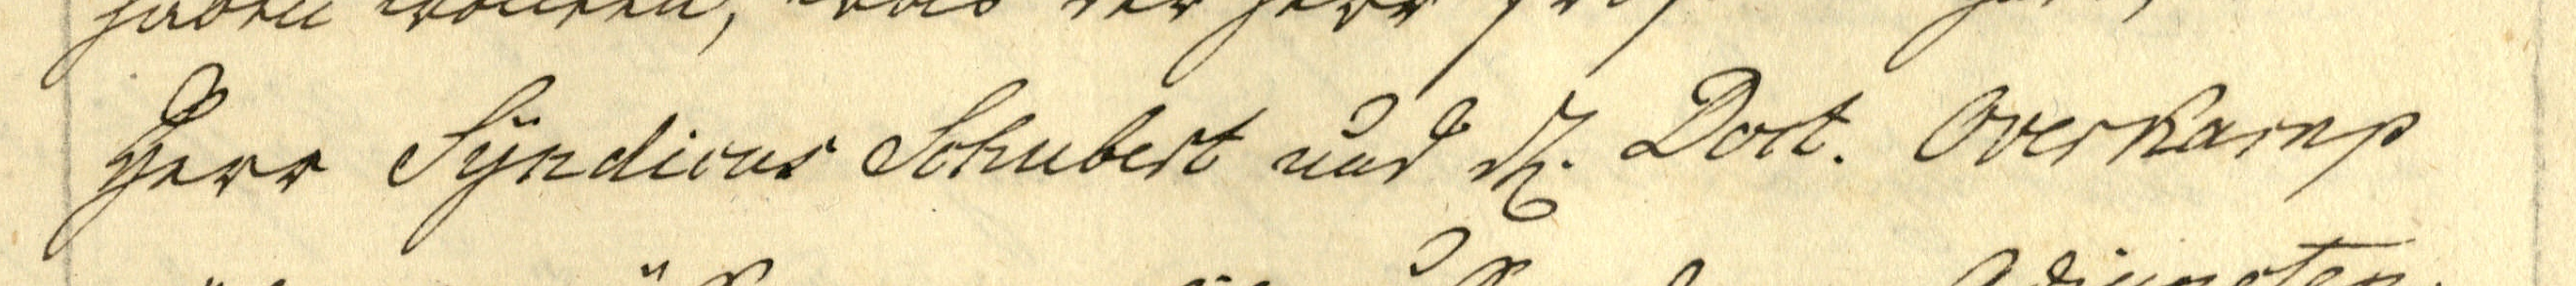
Herr Sÿndicus Schubert und dh. Doct. Overkamp
